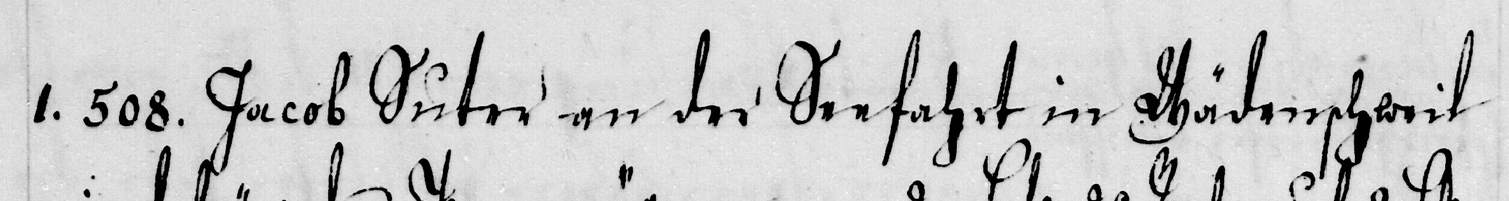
1. 508. Jacob Suter an der Seefahrt in Wädenschweil
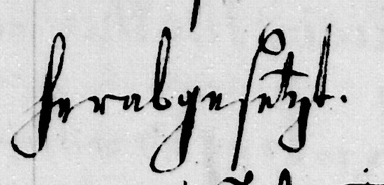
herabgesetzt.
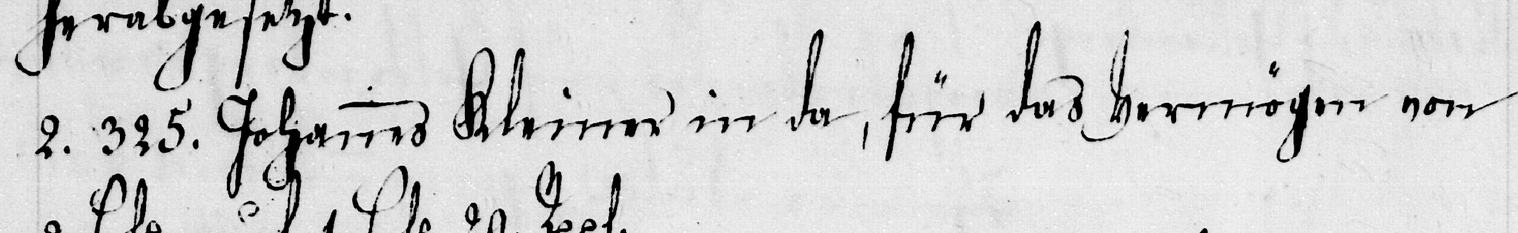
2. 325. Johannes Kleiner in da, für das Vermögen von
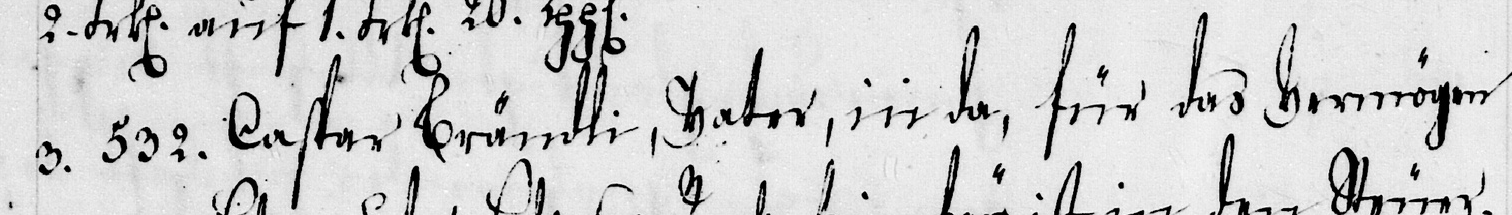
3. 532. Caspar Brändli, Vater, in da, für das Vermögen
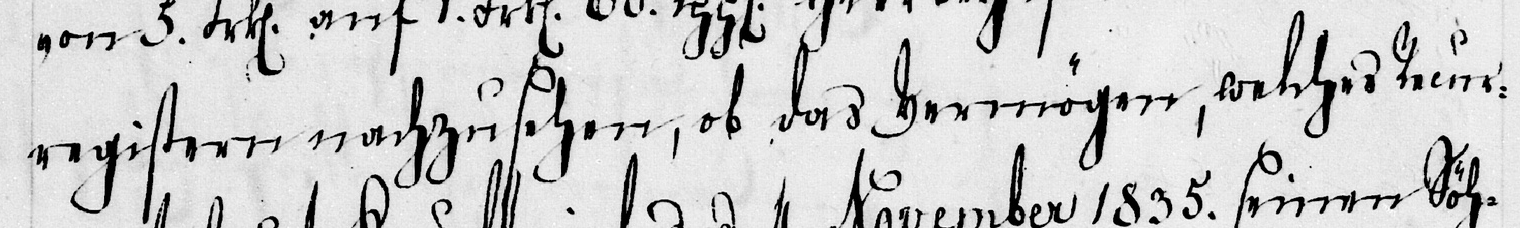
registern nachzusehen, ob das Vermögen, welches Recur¬
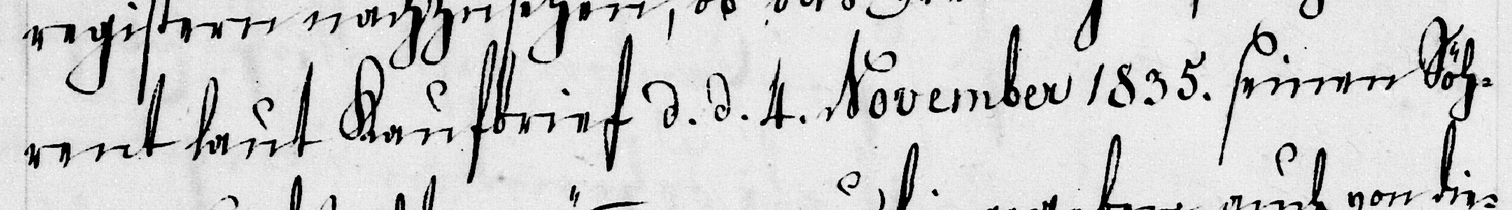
rent laut Kaufbrief d. d. 4. November 1835. seinen Söh¬
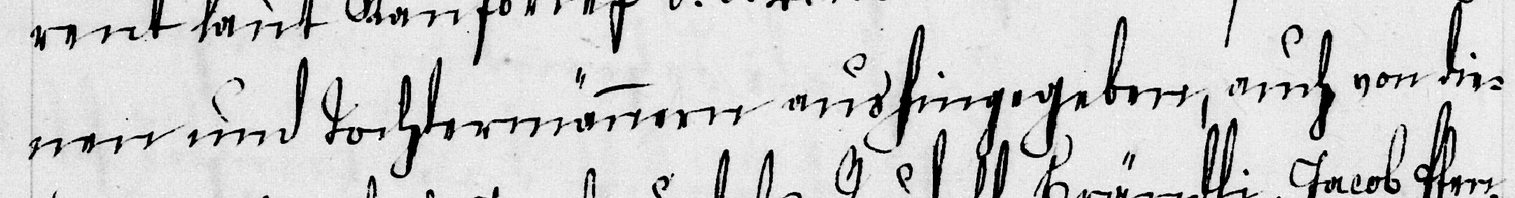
nen und Tochtermännern aushingegeben, auch von die¬
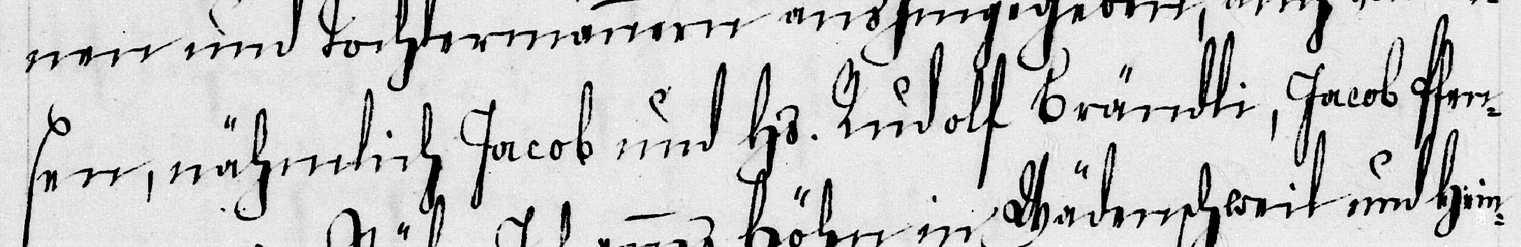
sen, nähmlich Jacob und Hs. Rudolf Brändli, Jacob Pfe¬
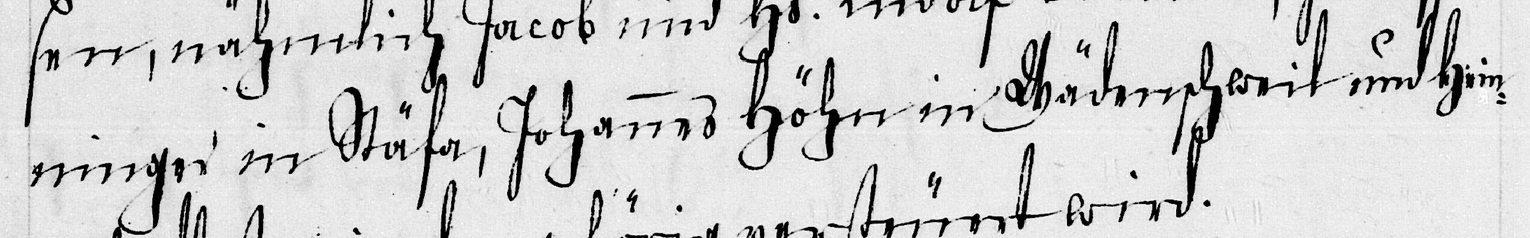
nninger in Stäfa, Johannes Höhn in Wädenschweil und Hein¬
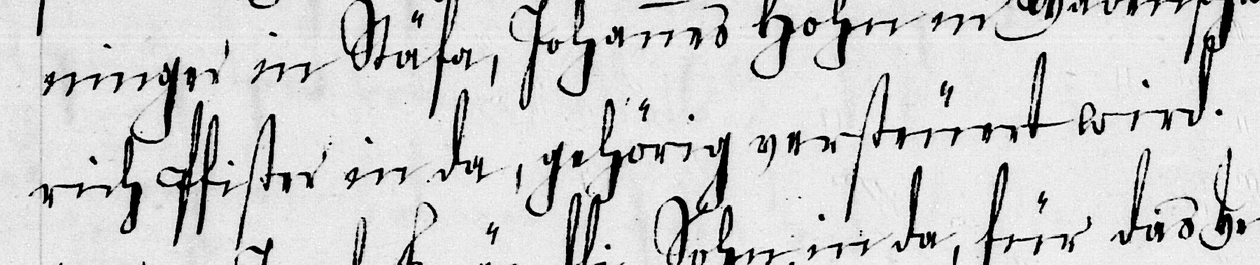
rich Pfister in da, gehörig versteuert wird.
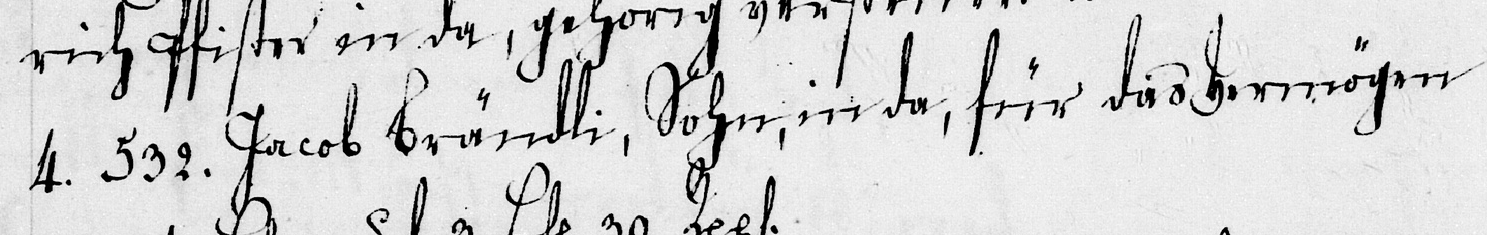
4. 532. Jacob Brändli, Sohn, in da, für das Vermögen
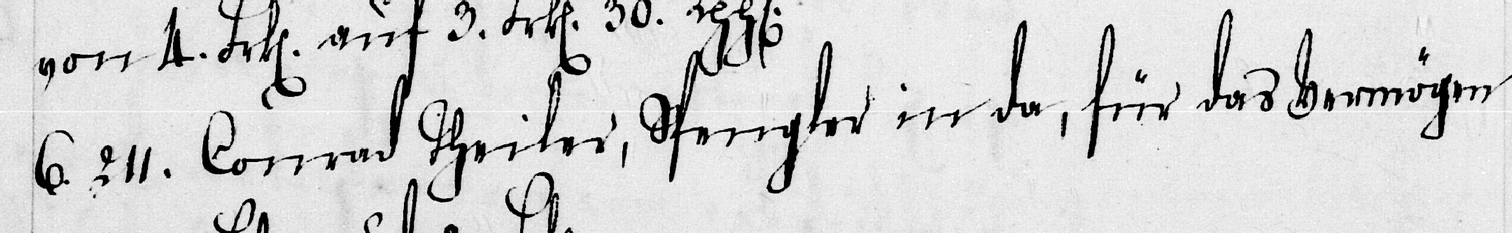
6. 211. Conrad Theiler, Spengler in da, für das Vermögen
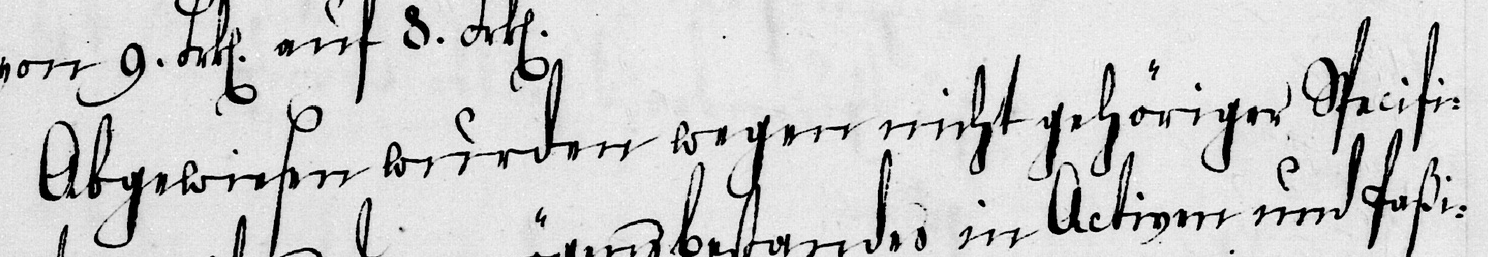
Abgewiesen wurden wegen nicht gehöriger Specifi¬
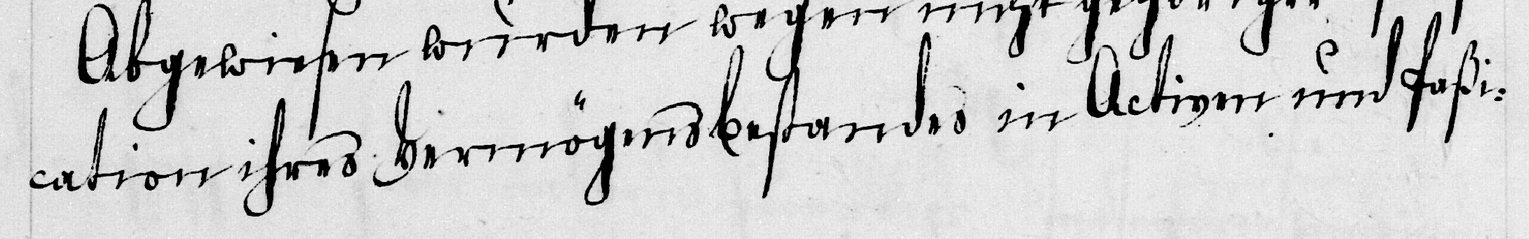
cation ihres Vermögensbestandes in Activen und Paßi¬
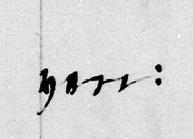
ven:
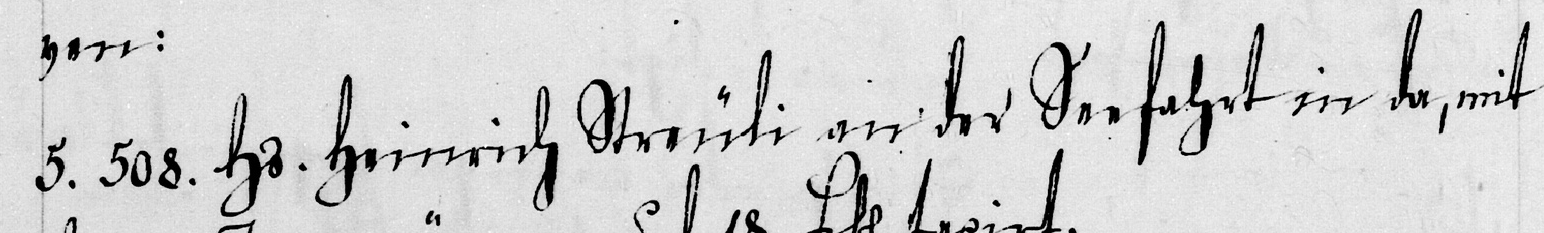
5. 508. Hs. Heinrich Streuli an der Seefahrt in da, mit
